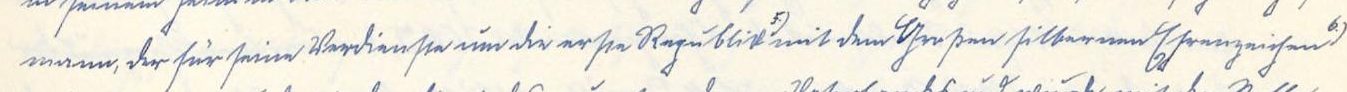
mann, der für seine Verdienste um die erste Republik 5) mit dem großen silbernen Ehrenzeichen 6)
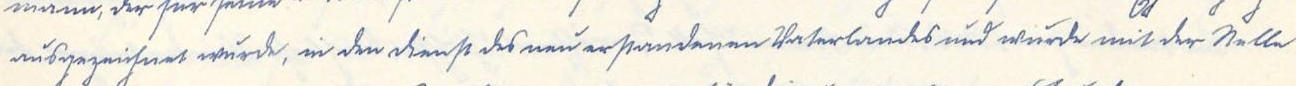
ausgezeichnet wurde, in den Dienst des neu erstandenen Vaterlandes und wurde mit der Stelle
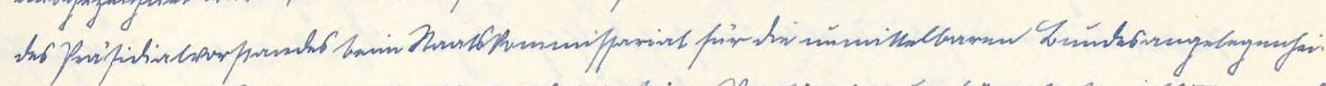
des Präsidialvorstandes beim Staatskommissariat für die unmittelbaren Bundesangelegenhei-
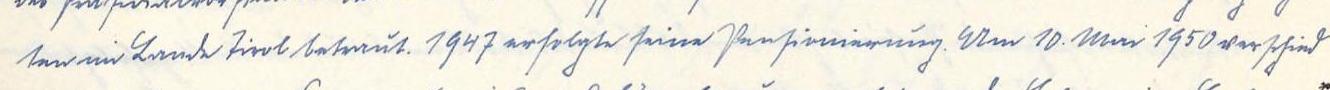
ten im Lande Tirol betraut. 1947 erfolgte seine Pensionierung. Am 10. Mai 1950 verschied
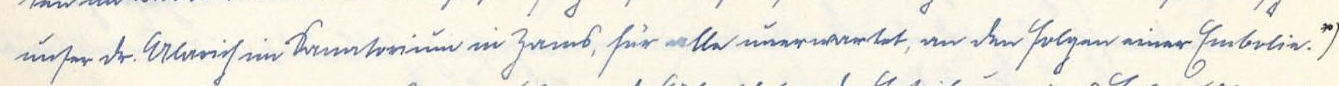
unser Dr. Alarich im Sanatorium in Zams, für alle unerwartet, an den Folgen einer Embolie *)
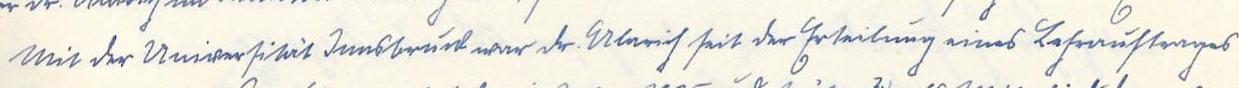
Mit der Universität Innsbruck war Dr. Alarich seit der Erteilung eines Lehrauftrages
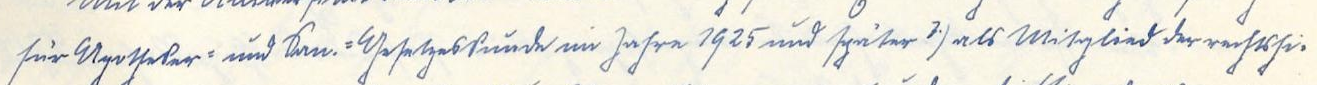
für Apotheker- und San.- Gesetzeskunde im Jahre 1925 und später 7) als Mitglied der rechtshi-
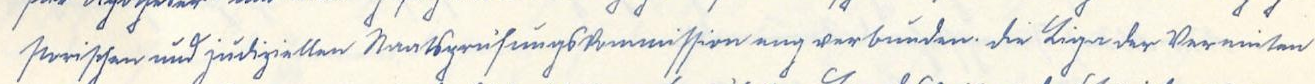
storischen und judiziellen Staatsprüfungskommission eng verbunden. Sie Liga der Vereinten
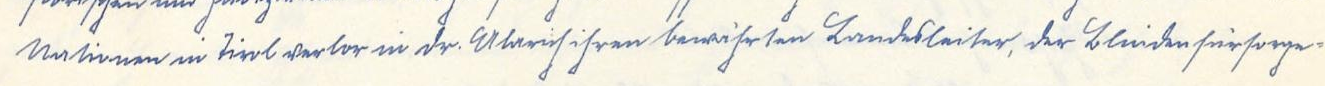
Nationen in Tirol verlor in Dr. Alarich ihren bewährten Landesleiter, der Blindenfürsorge-
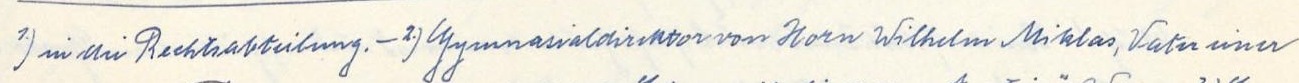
1) in der Rechtsabteilung.- 2) Gymnasialdirektor von Horn Wilhelm Miklas, Vater einer
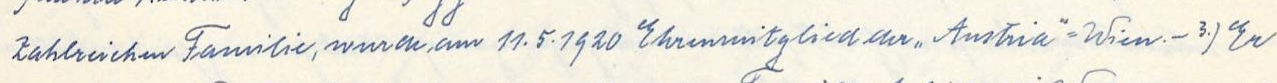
zahlreichen Familie, wurde am 11.5.1920 Ehrenmitglied der „Austria“-Wien.- 3) Er
